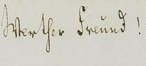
Werther Freund!
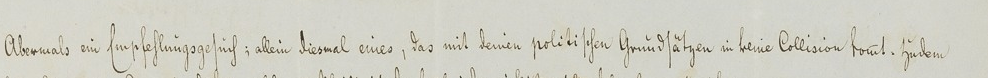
Abermals ein Empfehlungsgesuch; allein diesmal eines, das mit deinen politischen Grundsätzen in keine Collision kommt. Zudem
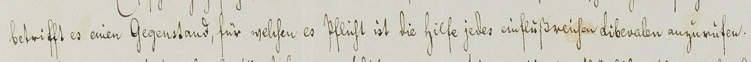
betrifft es einen Gegenstand, für welchen es Pflicht ist die Hilfe jedes einflußreichen Liberalen anzurufen.
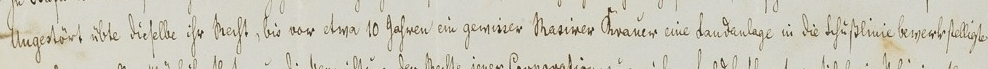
Ungestört übte dieselbe ihr Recht, bis vor etwa 10 Jahren ein gewisser Rasirer Krauer eine Landanlage in die Schußlinie bewerkstelligte
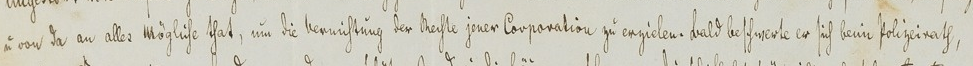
u von da an alles Mögliche that, um die Vernichtung der Rechte jener Corporation zu erzielen. Bald beschwerte er sich beim Polizeirath,
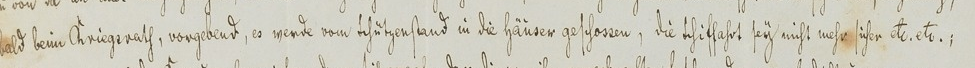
bald beim Kriegsrath, vorgebend, es werde vom Schützenstand in die Häuser geschossen, die Schiffahrt sey nicht mehr sicher etc. etc.;
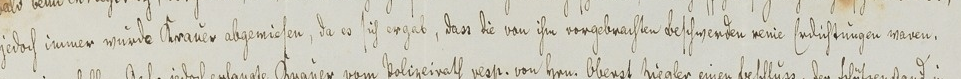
jedoch immer wurde Krauer abgewiesen, da es sich ergab, dass die von ihm vorgebrachten Beschwerden reine Erdichtungen waren.
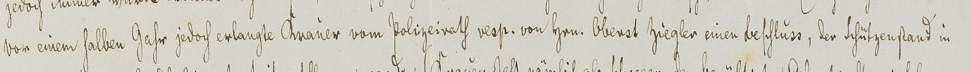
Vor einem halben Jahr jedoch erlangte Krauer vom Polizeirath resp. von Hrn. Oberst Ziegler einen Beschluss, der Schützenstand in
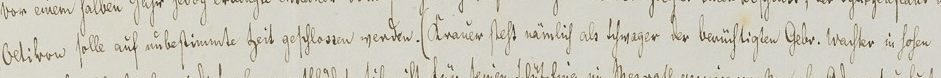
Oetikon solle auf unbestimmte Zeit geschlossen werden. (Krauer steht nämlich als Schwager der berüchtigten Gebr. Wachter in hohen
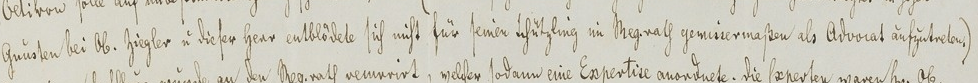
Gunsten bei Ob. Ziegler u dieser Herr entblödete sich nicht für seinen Schützling im Reg.rath gewissermaßen als Advocat aufzutreten.)
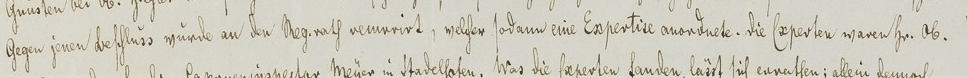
Gegen jenen Beschluss wurde an den Reg.rath recurrirt, welcher sodann eine Expertise anordnete. Die Experten waren Hr. Ob.
